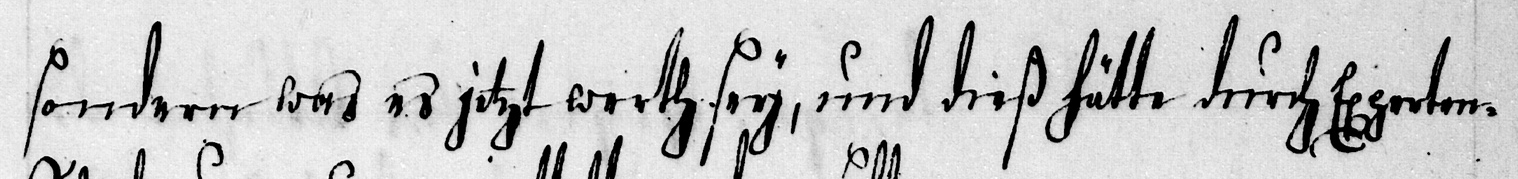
sondern was es jetzt werth sey, und dieß hätte durch Experte¬
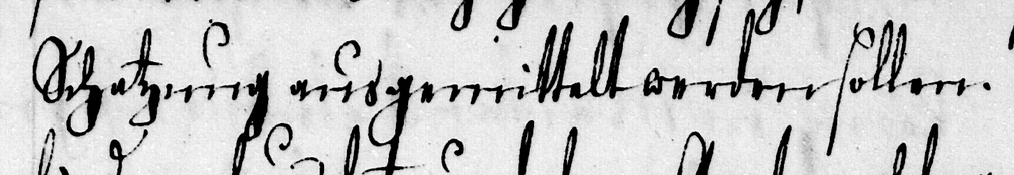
chatzung ausgemittelt werden sollen.
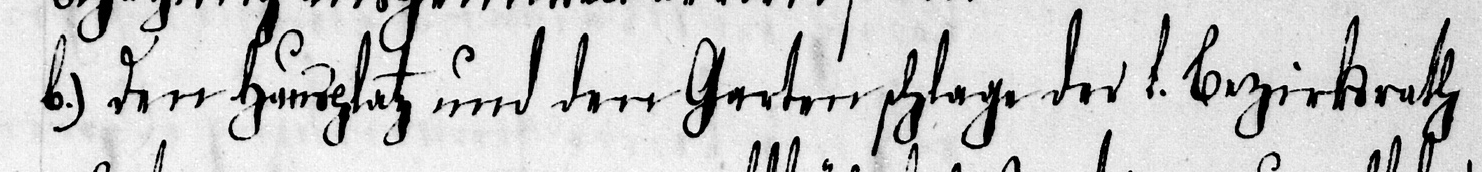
b.) Den Hausplatz und den Garten schlage der L. Bezirksrath
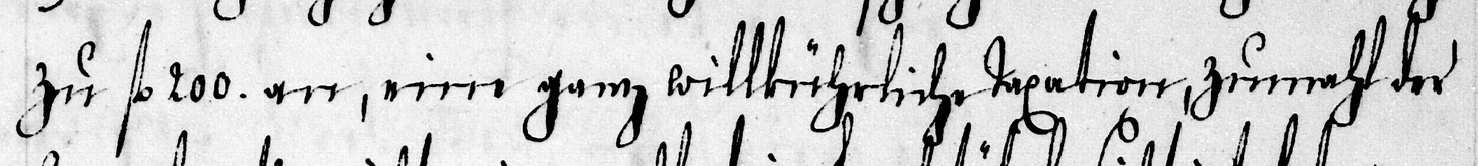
zu fl 200. an, eine ganz willkührliche Taxation, zumahl der
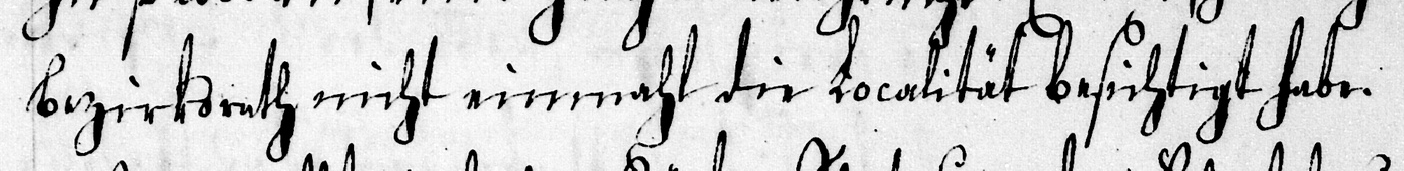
Bezirksrath nicht einmahl die Localität besichtigt habe.
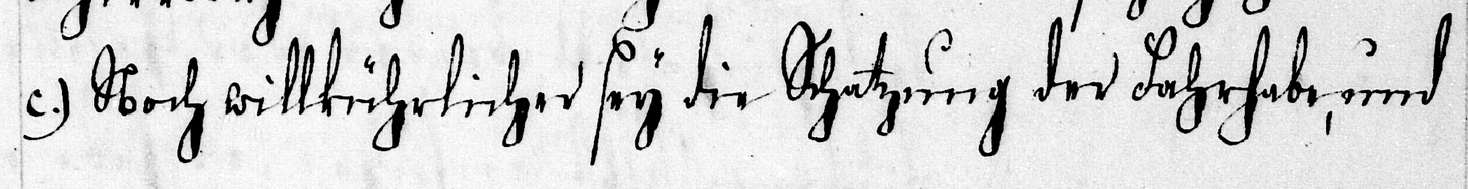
c.) Noch willkührlicher sey die Schatzung der Fahrhabe, und
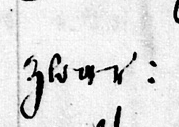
zwar:
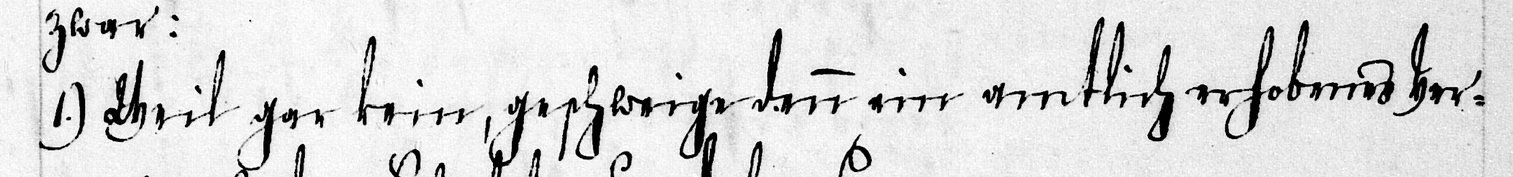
1.) Weil gar kein, geschweige denn ein amtlich erhobenes Ver¬
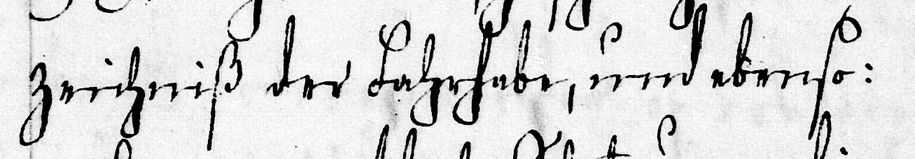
zeichniß der Fahrhabe, und ebenso:
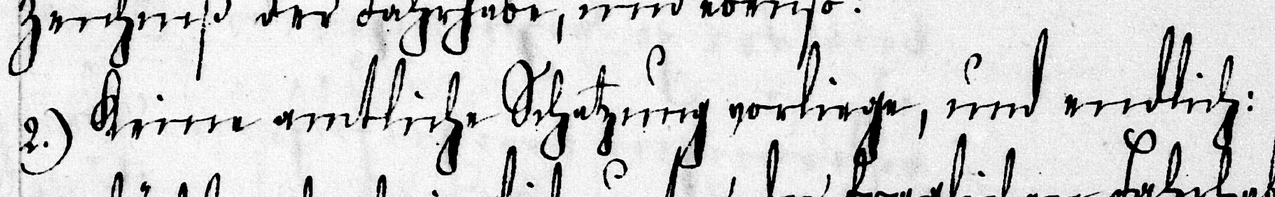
2.) Keine amtliche Schatzung vorliege, und endlich:
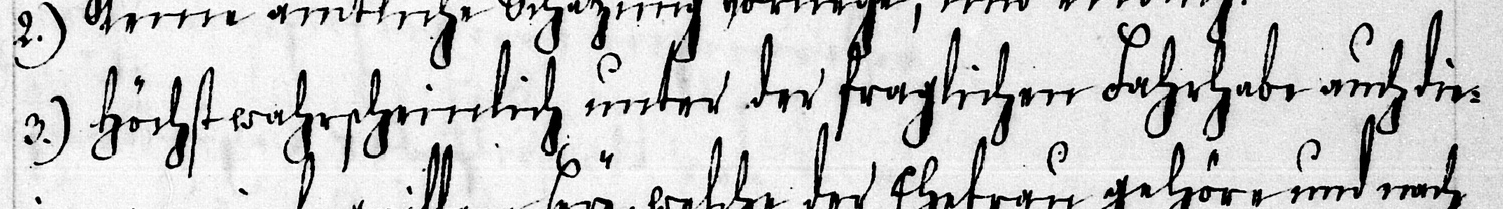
3.) Höchst wahrscheinlich unter der fraglichen Fahrhabe auch die¬
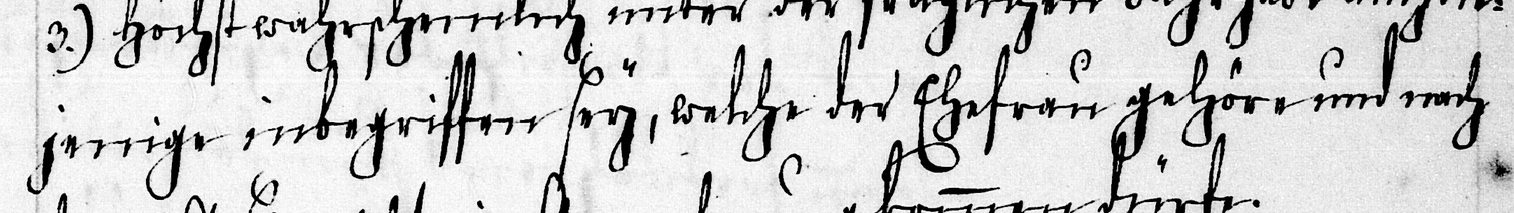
jenige inbegriffen sey, welche der Ehefrau gehöre und nach
